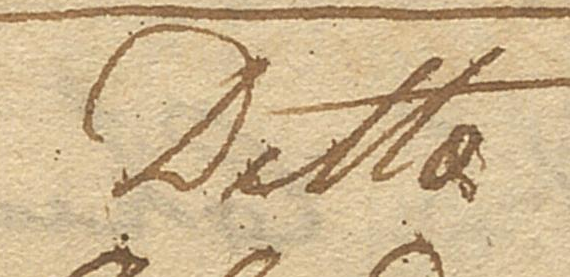Ditto
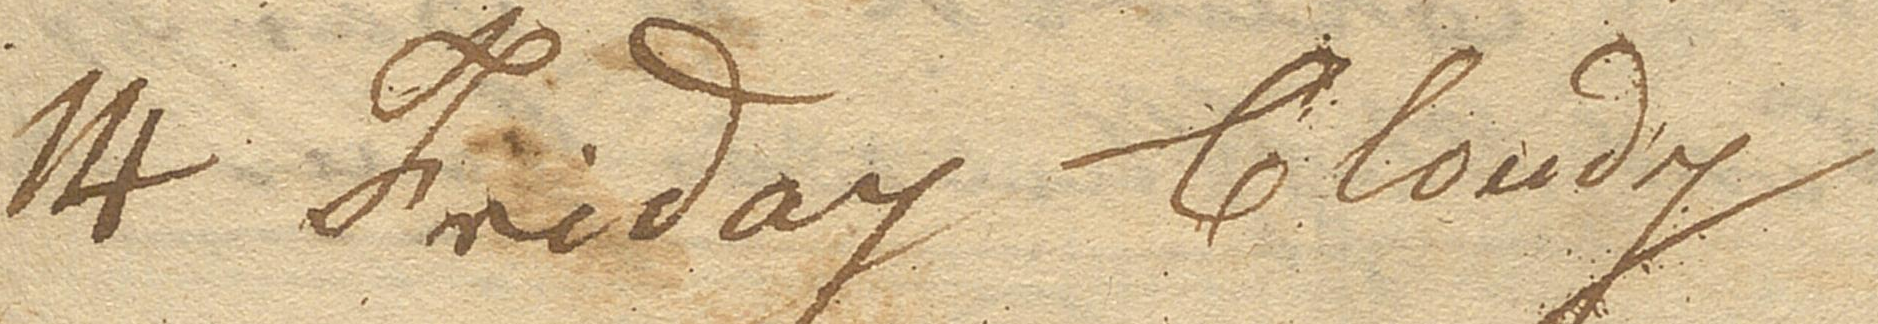14 Friday Cloudy
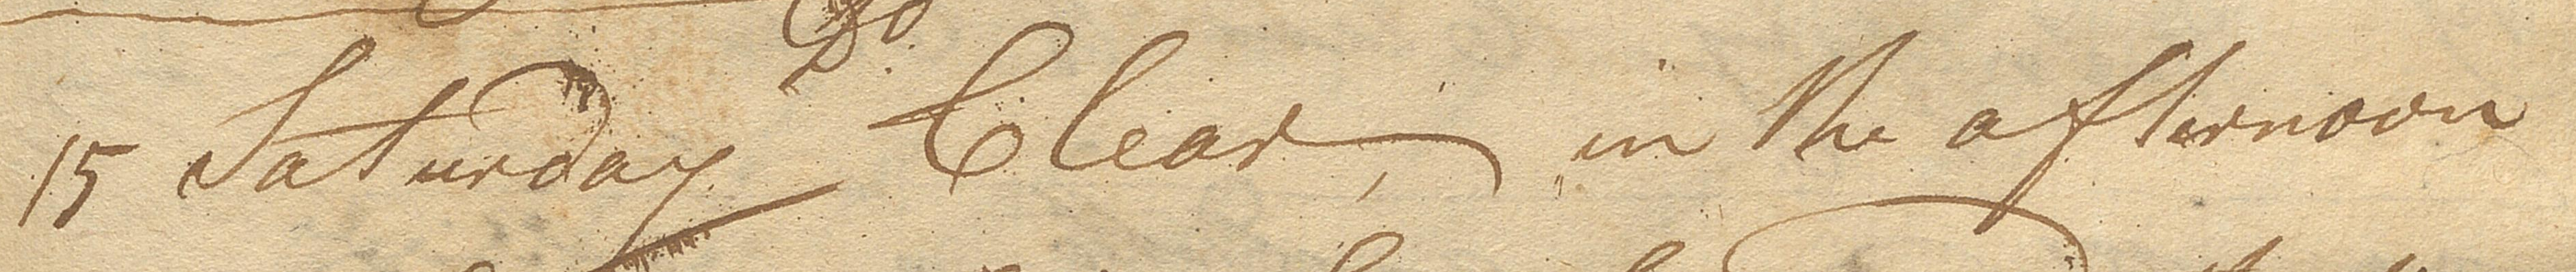15 Saturday Clear in the afternoon
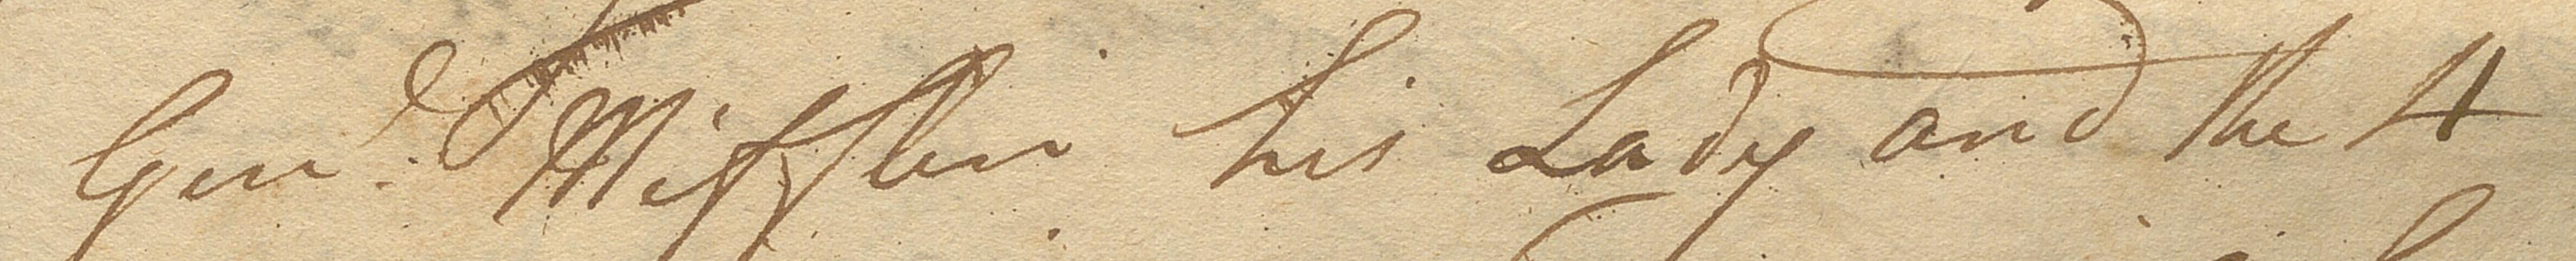Gen^l. Mifflin his Lady and the 4
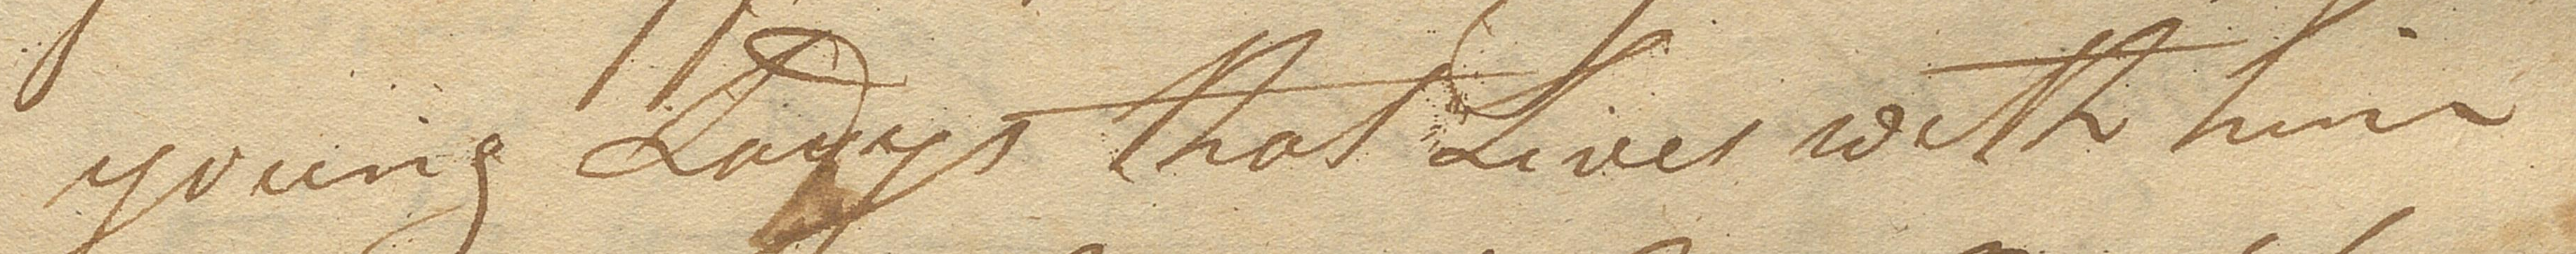young Ladys that Lives with him
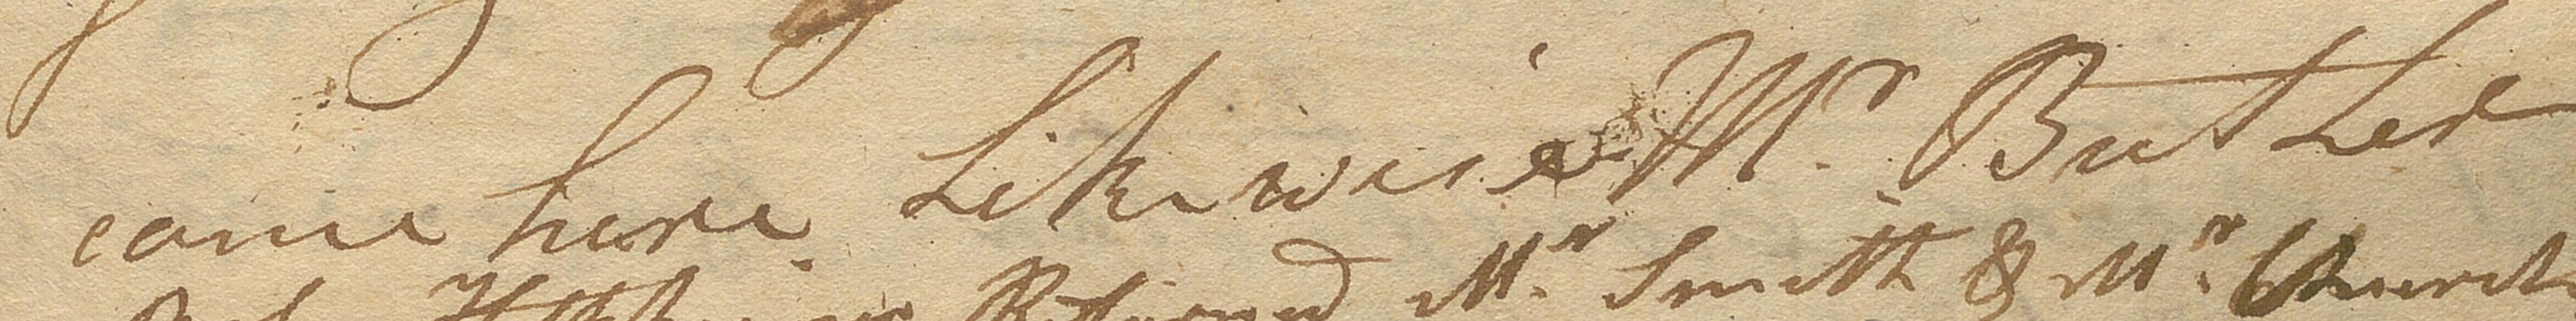came here Likewise M^r. Butler
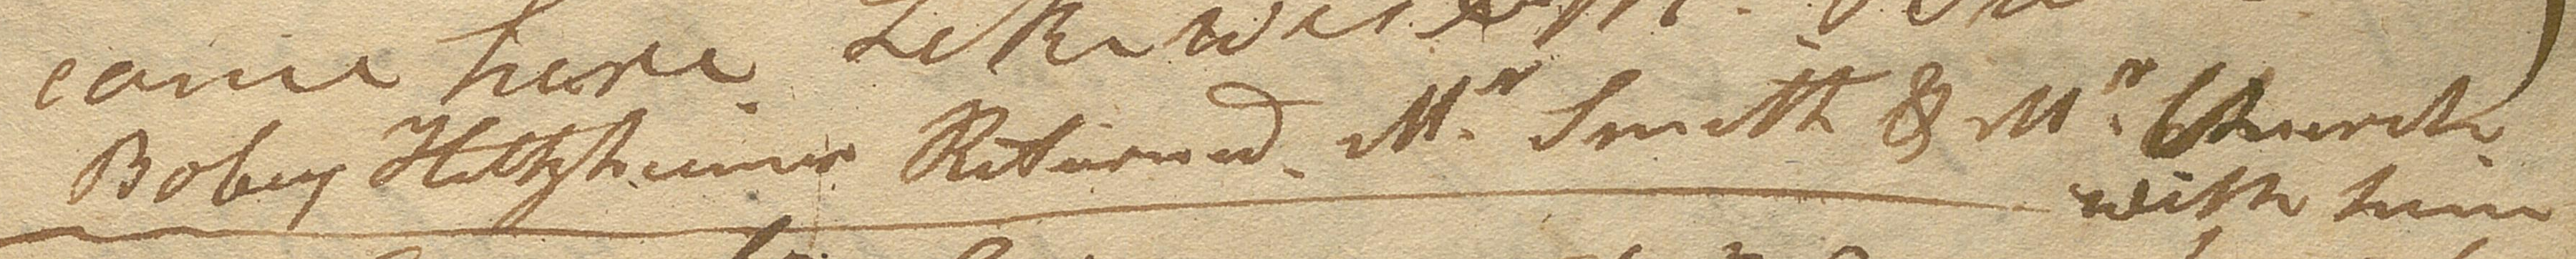Bobey Hiltzheimer Returned M^r. Smith & M^r. Church
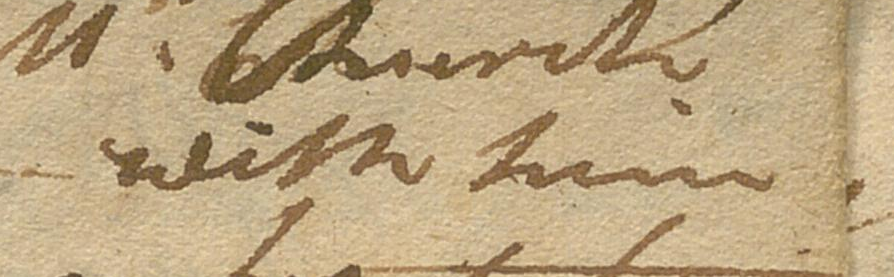with him
